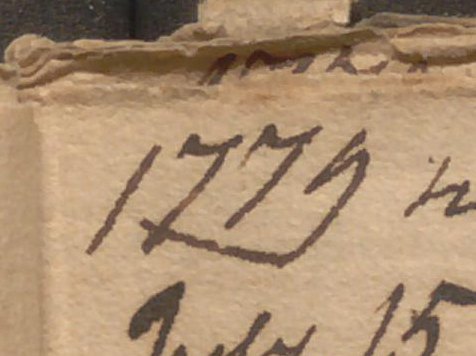1779
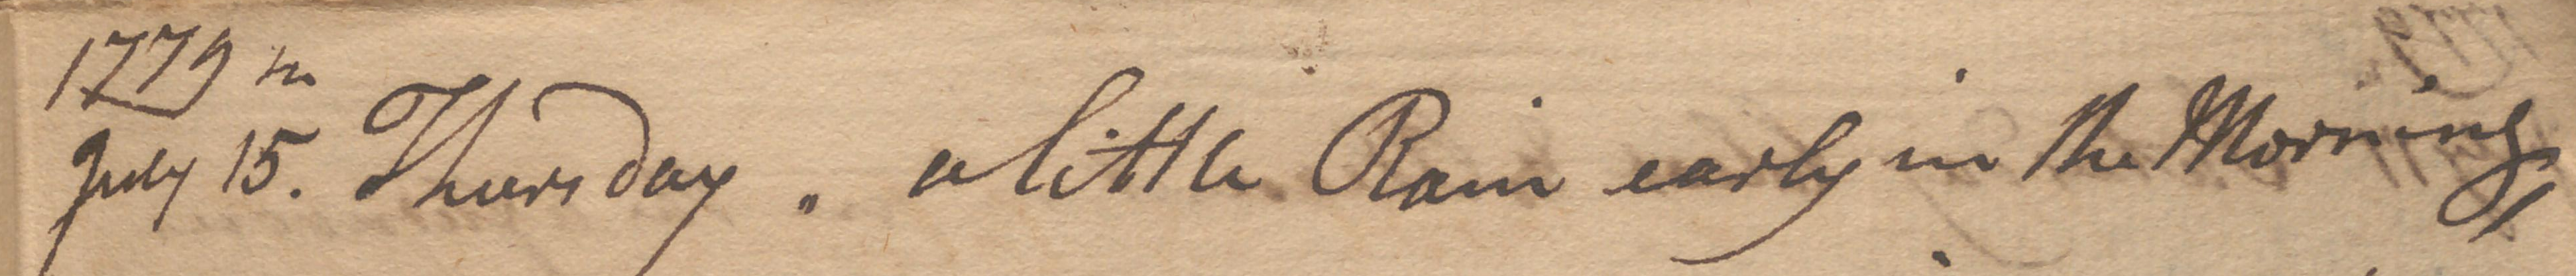July 15^th. Thursday. a little Rain early in the Morning
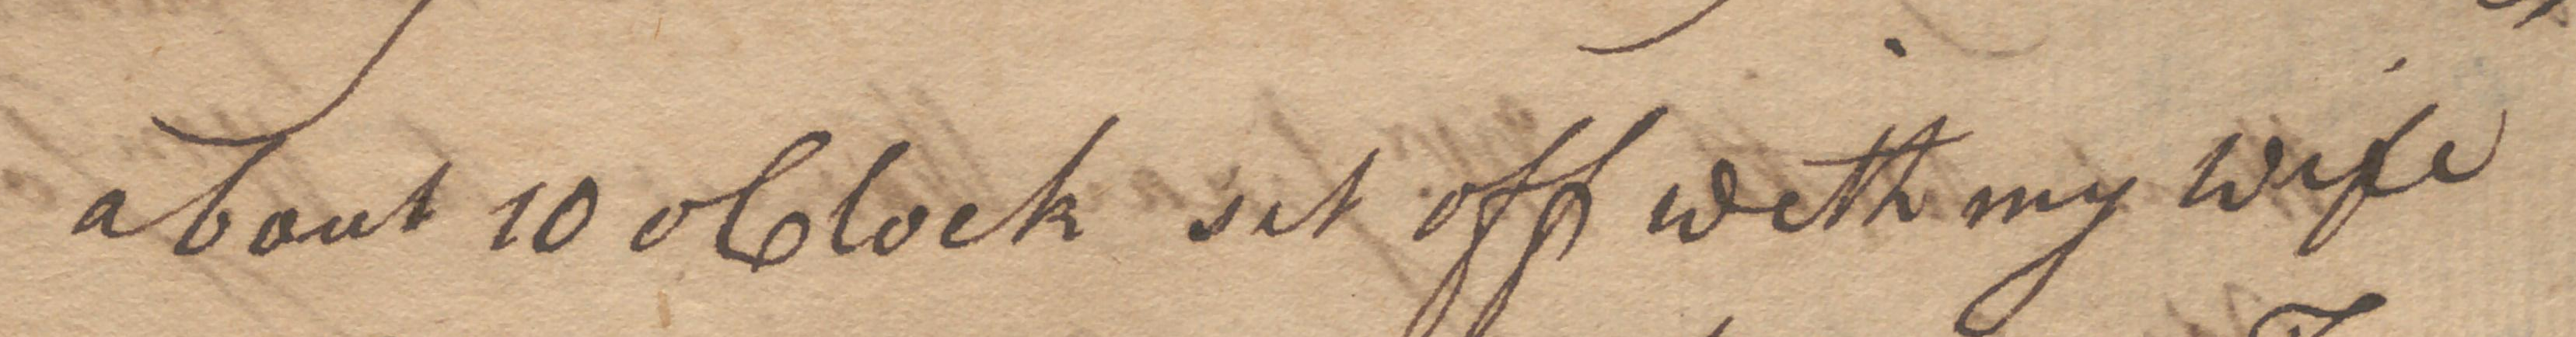about 10 oClock set off with my wife
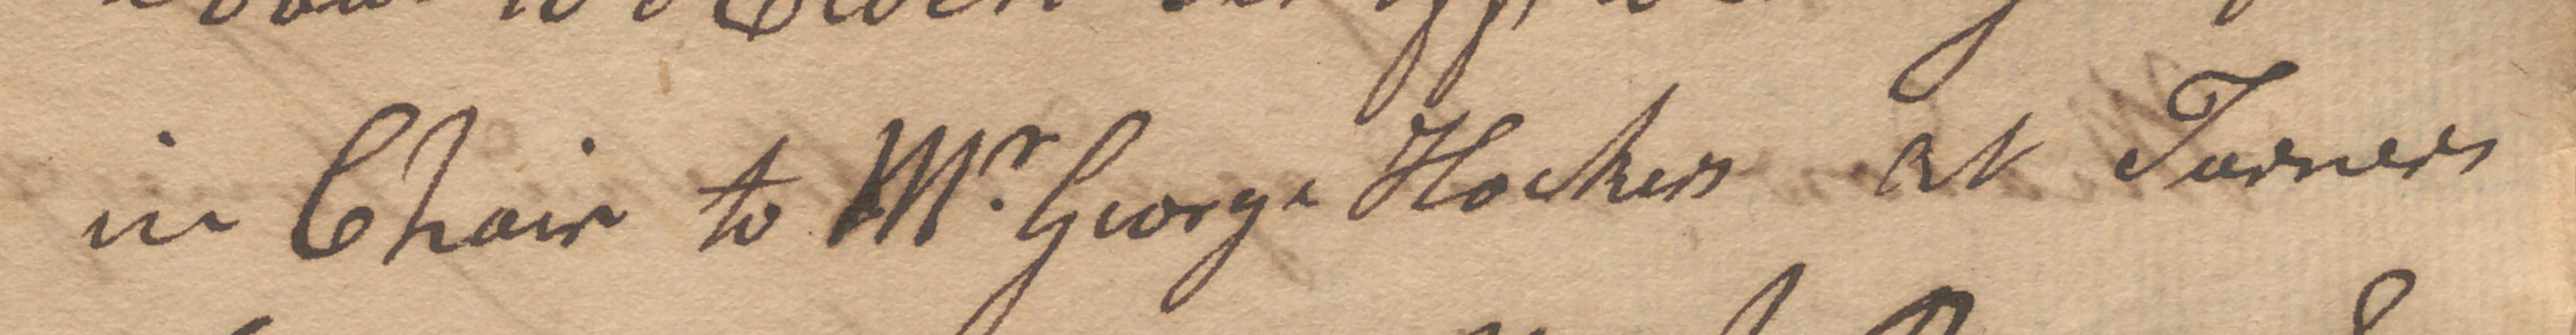in Chair to M^r. Georga Hockers atTJurners
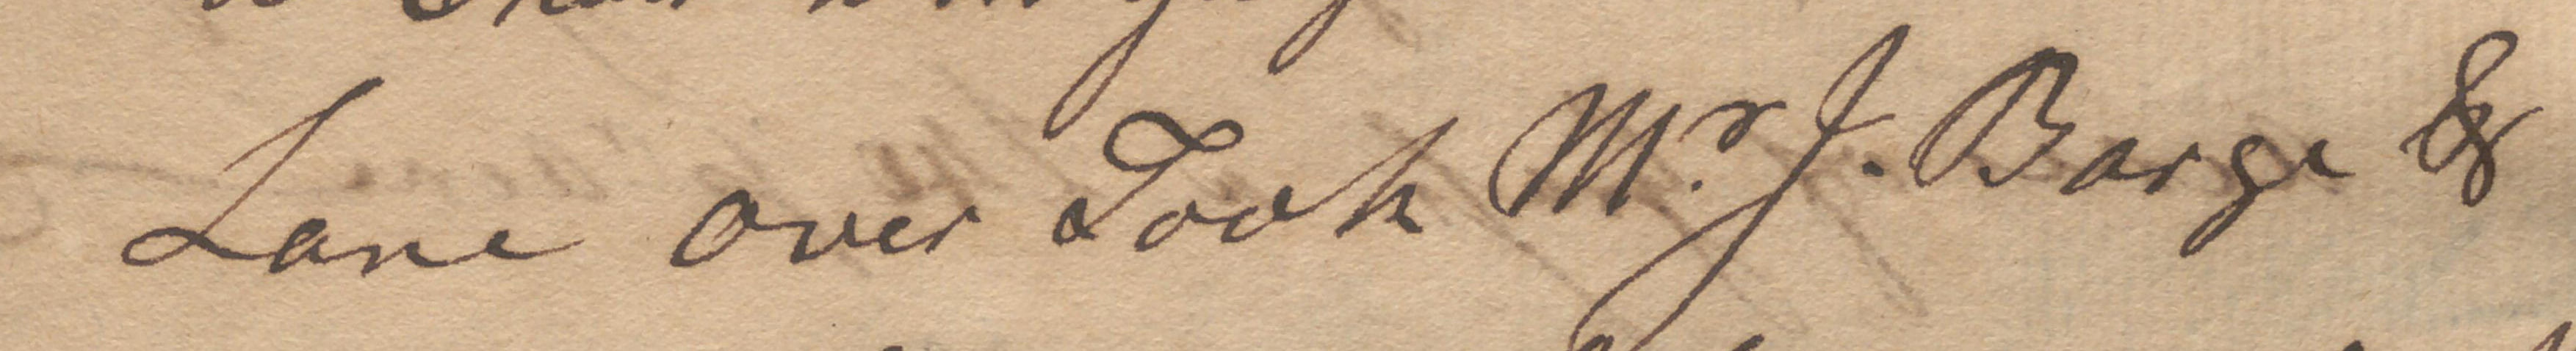Lane over Took M^r. J. Barge &
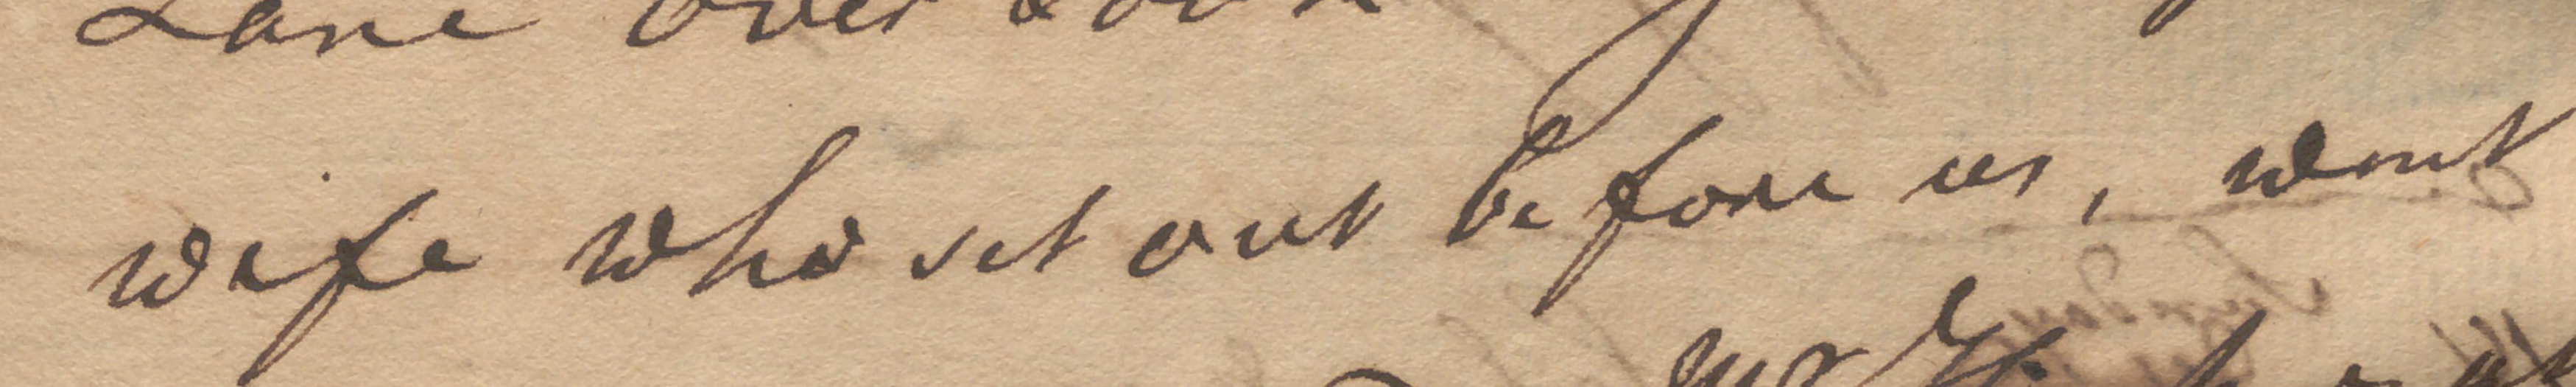wife who set out before us, went
